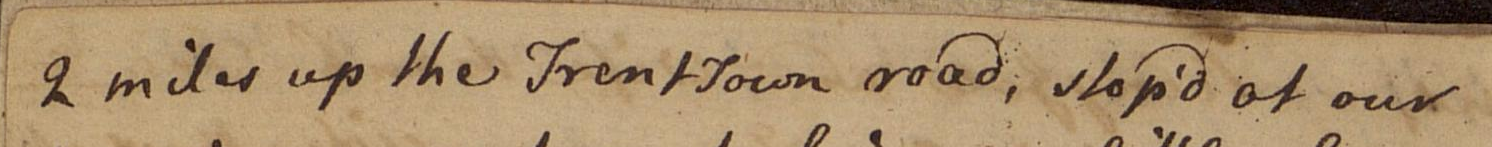2 miles up the Trent Town road, stop'd at our
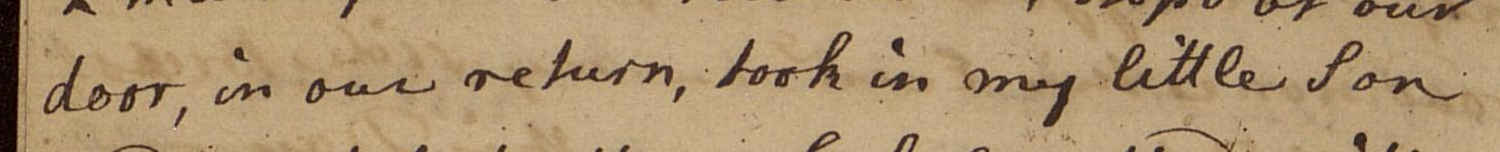door, in our return, took in my little Son
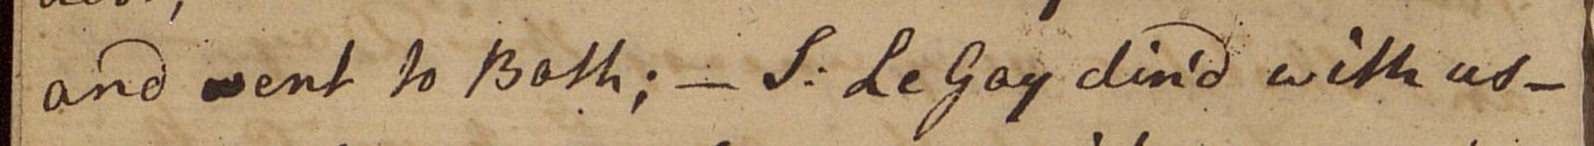and went to Bath;- S: LeGay din'd with us-
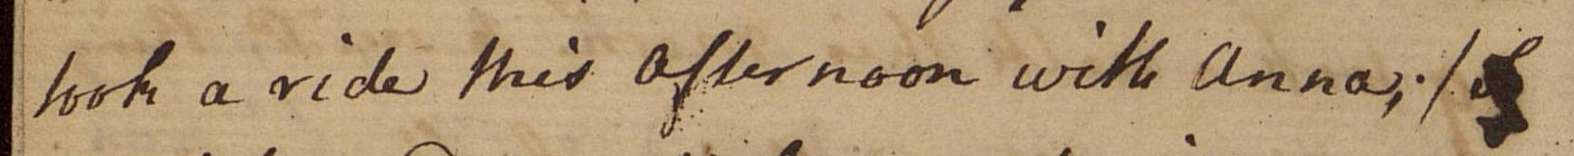took a ride this afternoon with Anna;/ S
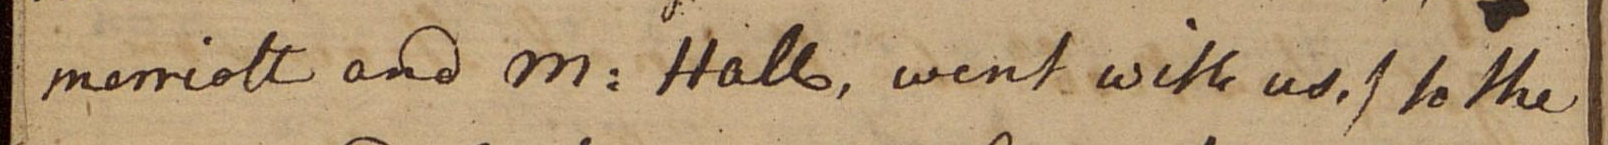merriott and M: Hall, went with us,/ to the
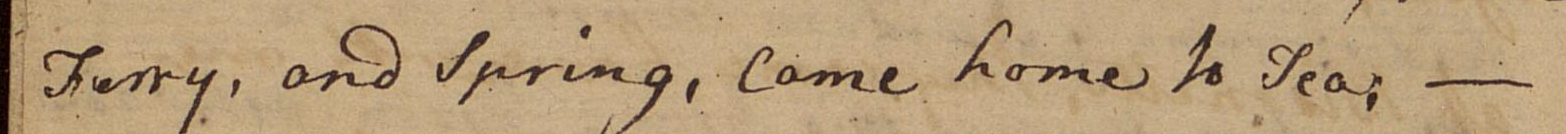Ferry, and Spring, came home to Tea,-
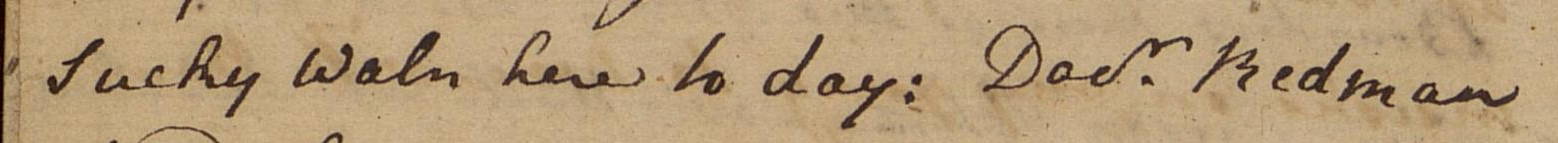Sueky Waln here to day; Doc^r. Redman
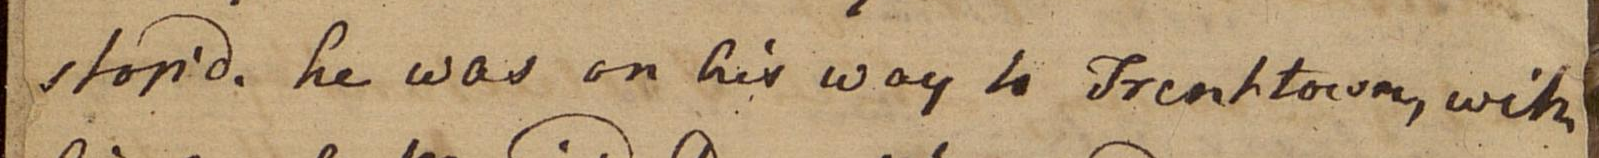stop'd. he was on his way to Frenhtown, with
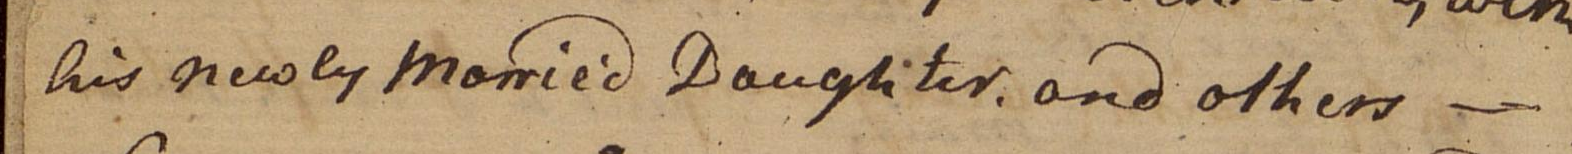his newly Married Daughter, and others-
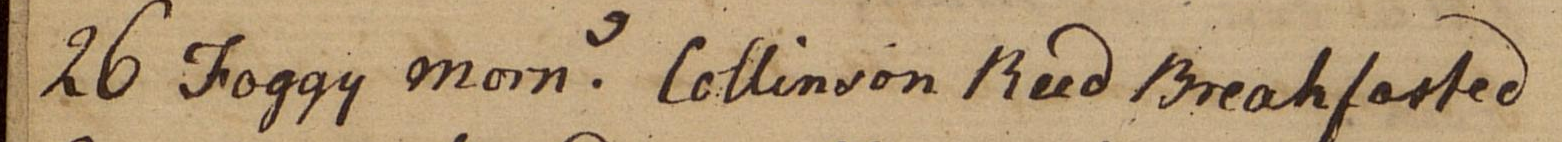26 Foggy morn^g. Collinson Reed Breakfasted
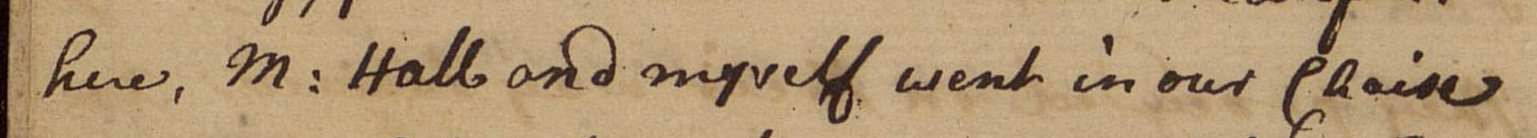here, M: Hall and myself went in our Chaise
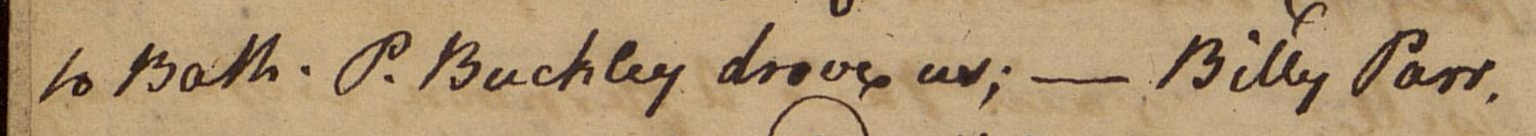to Bath. P. Buckley drove us;- Billy Parr
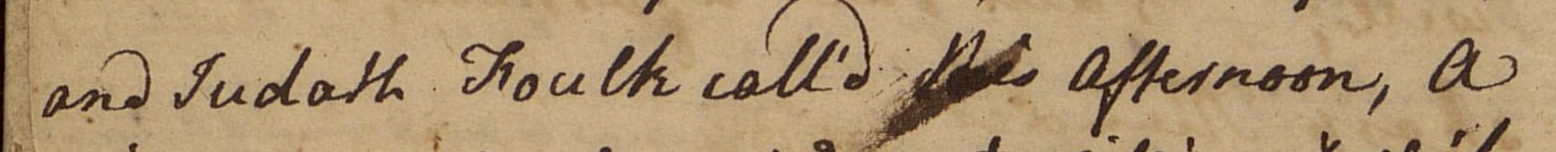and Judath Foulk call'd this afternoon, a
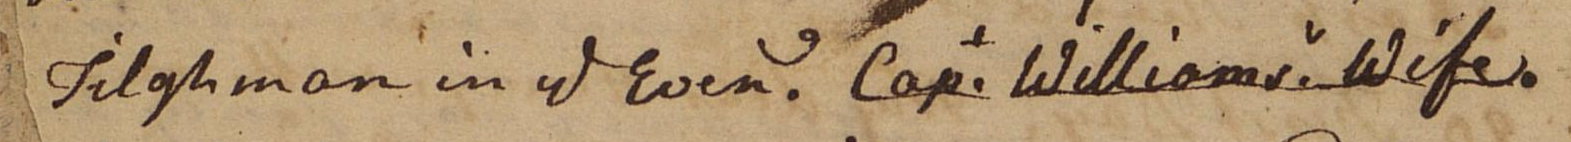Tilghman in y^e Even^g. Cap^t. Williams Wife.
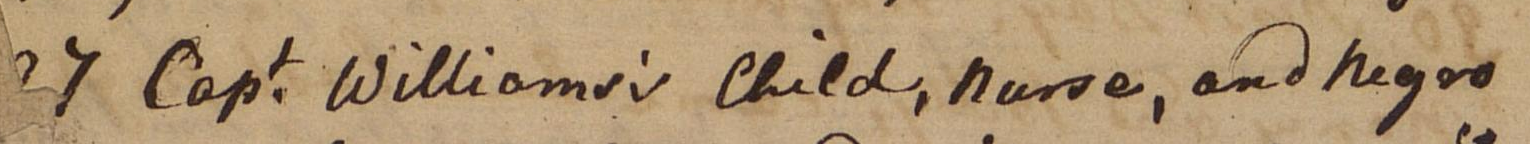[2]7 Cap^t. Williams's Child, Nurse, and Negro
